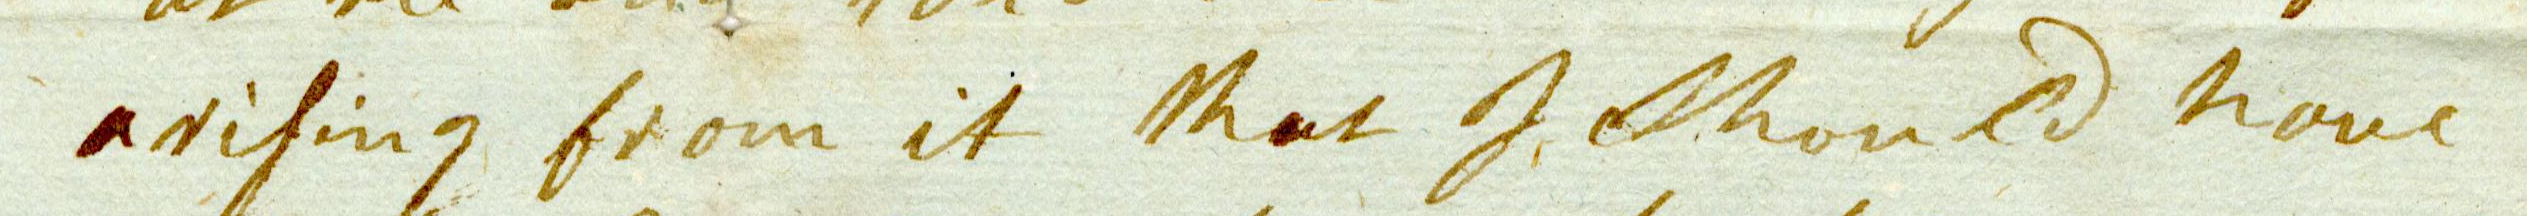arising from it that I should have
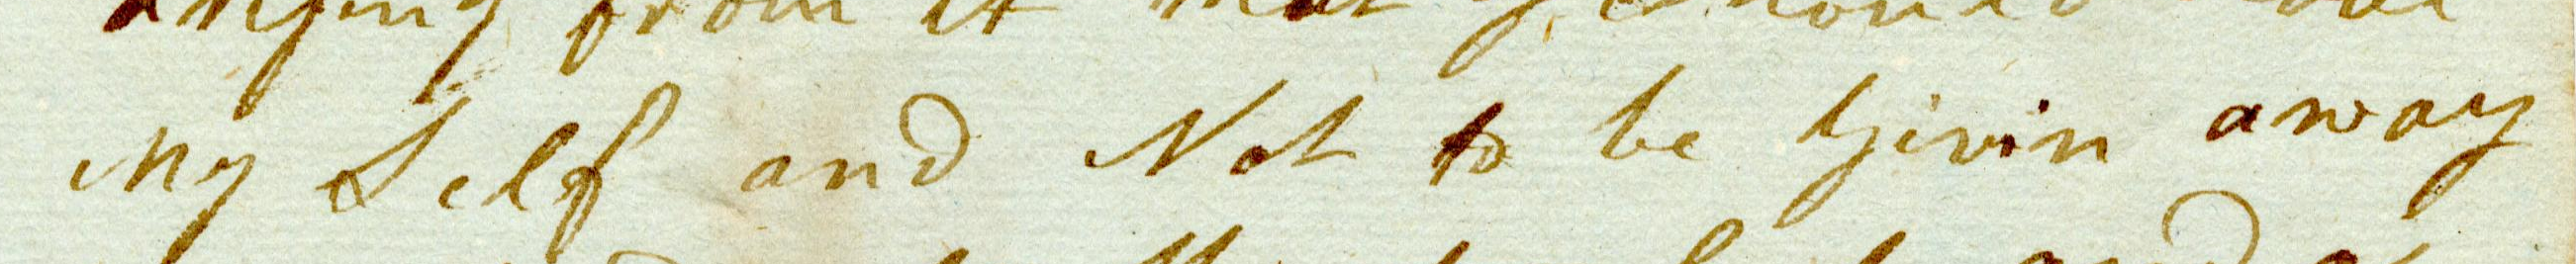my self and Not to be Givin away
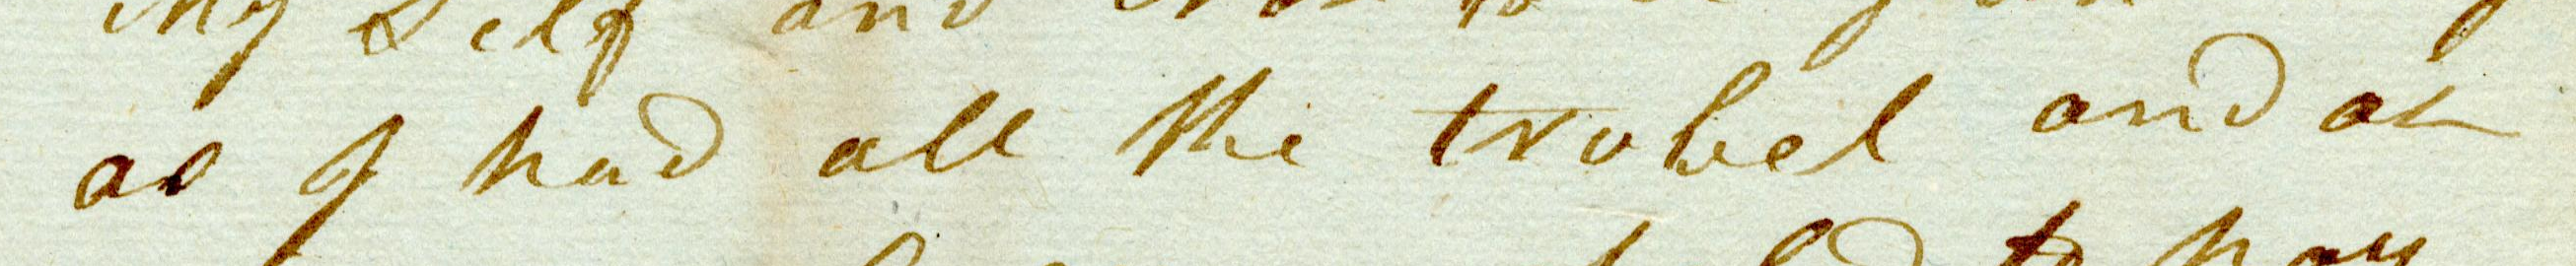as I had all the trobel and at
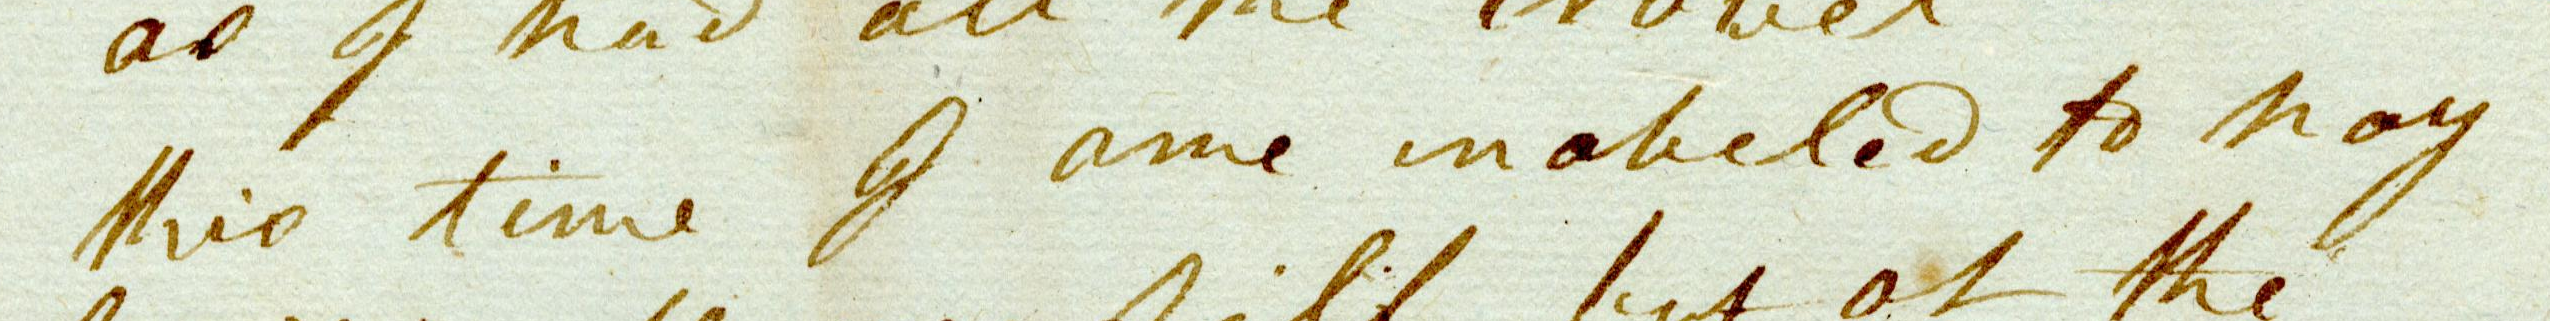this time I ame inabeled to pay
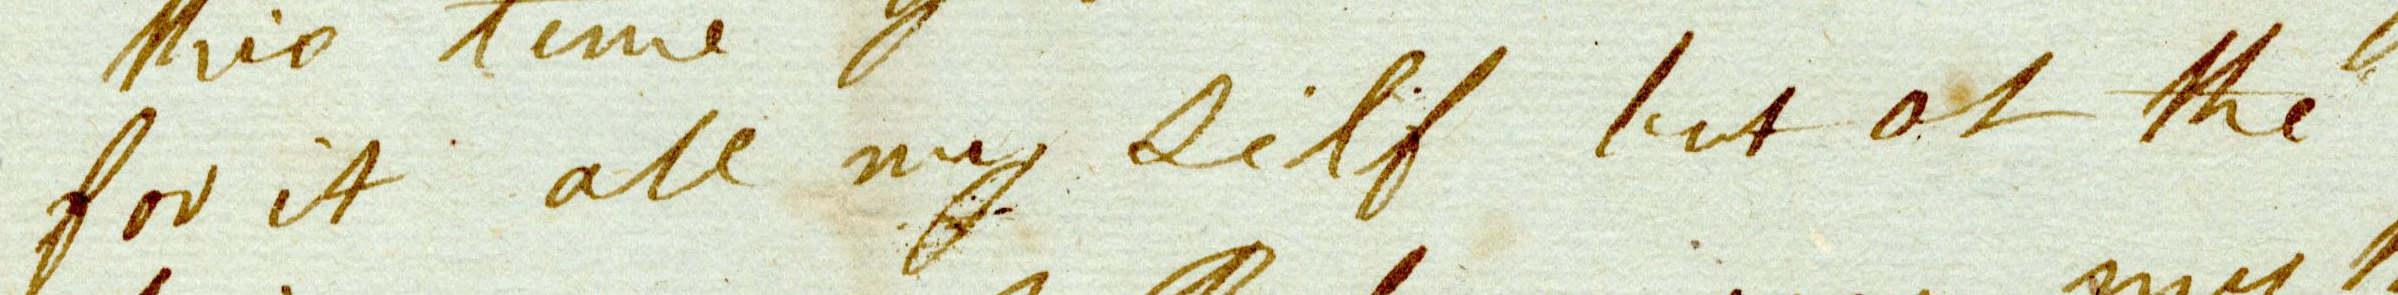for it all my silf but at the
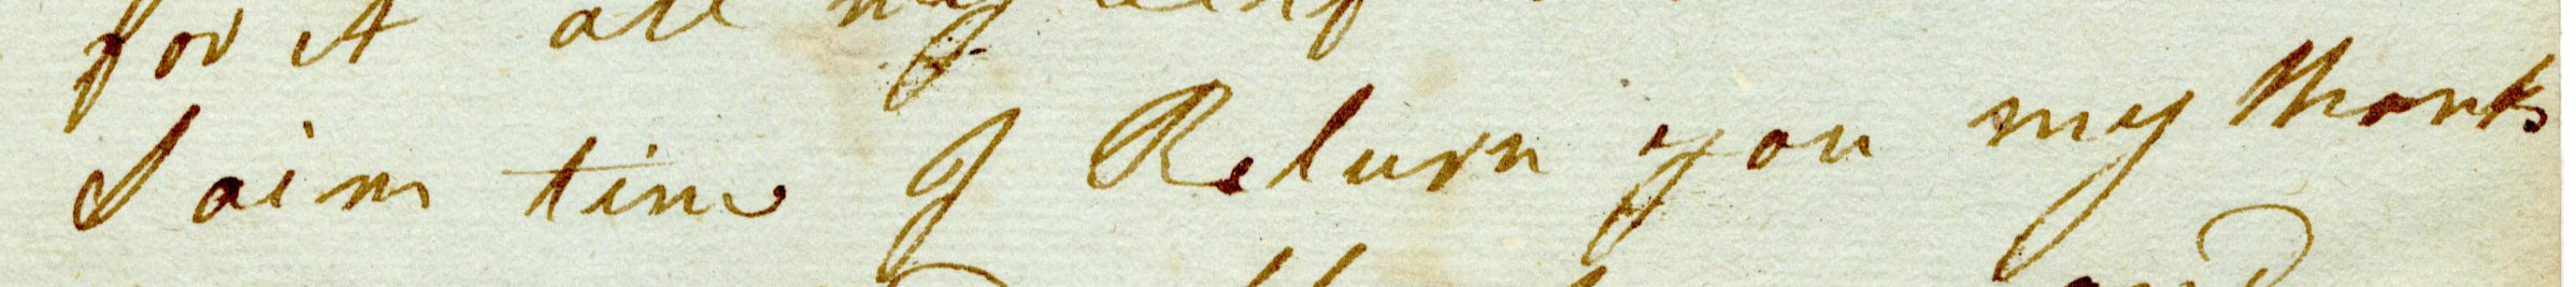saim tim I Return you my thank
